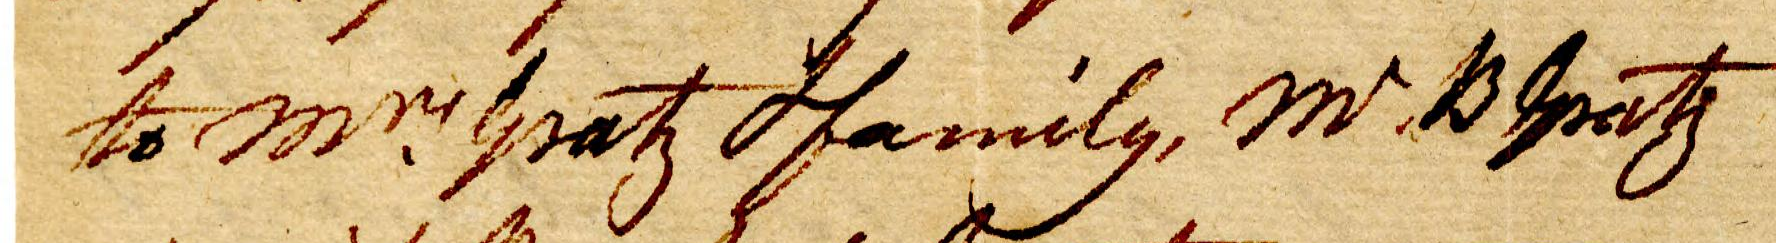to M^rs. Gratz & family, M^r B Gratz
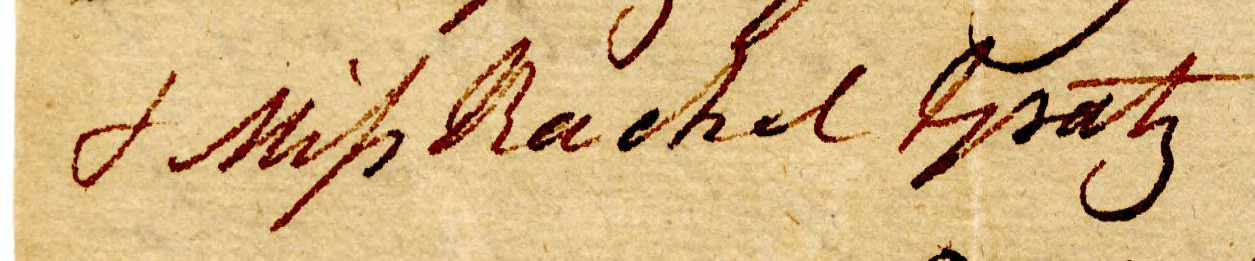& Miss Rachel Gratz.-
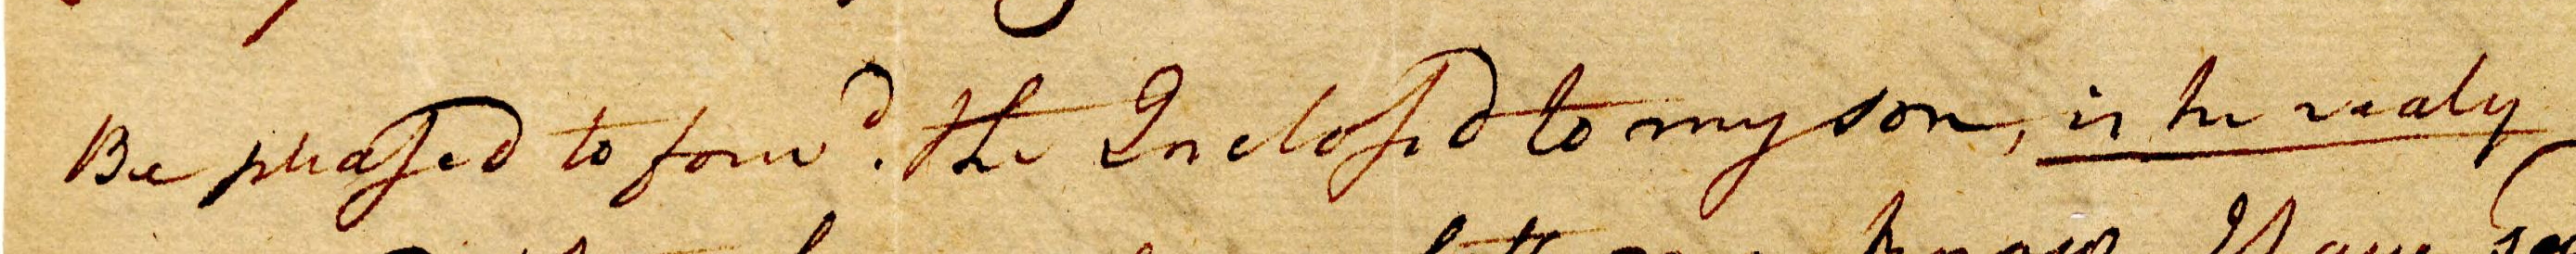Be pleased to forw^d the Incloss'd to my son, is he realy
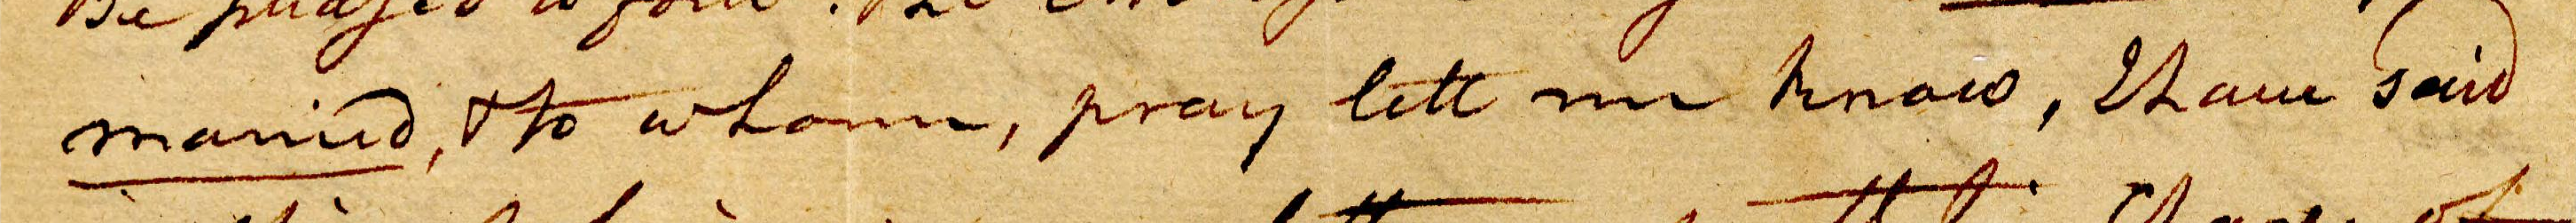married, & to whom, pray lett me know, I have said
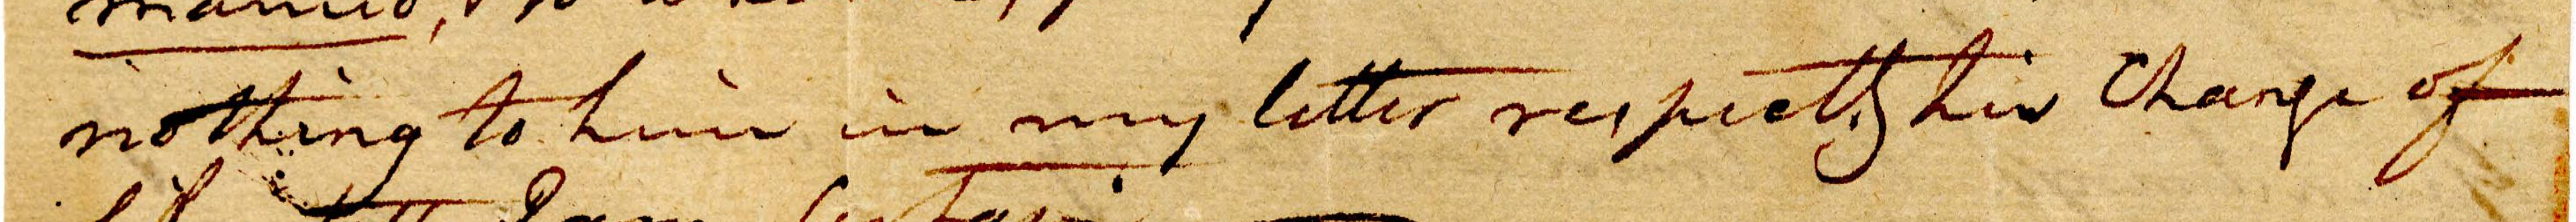nothing to him in my letter respect^g. his change of
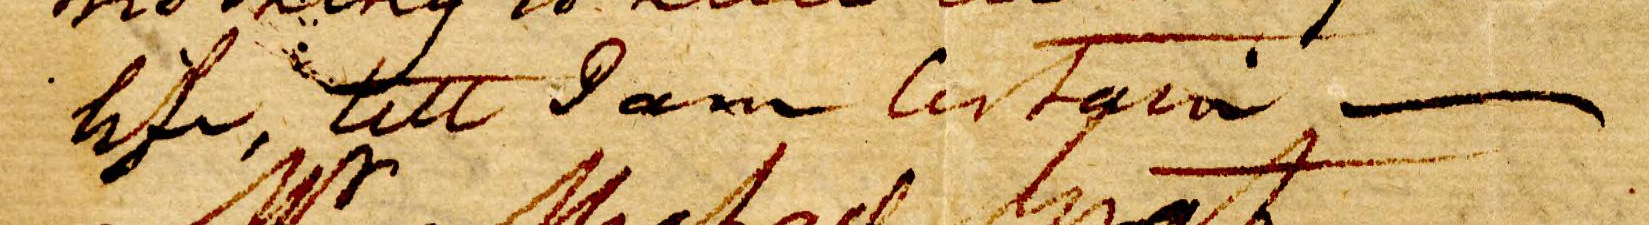life tell I am certain.-
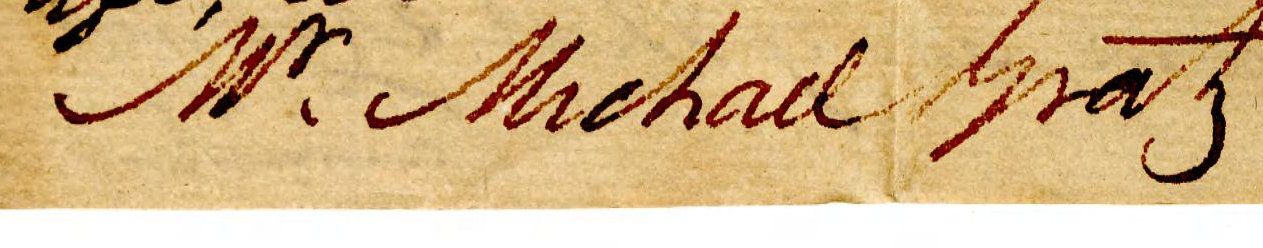M^r. Michael Gratz
